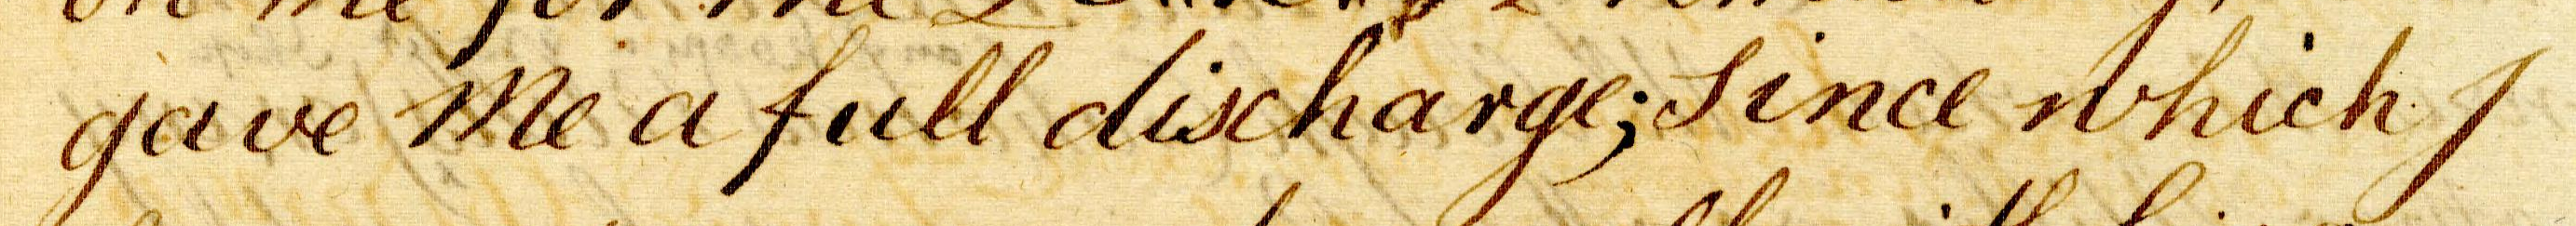gave Me a full discharge; Since which I
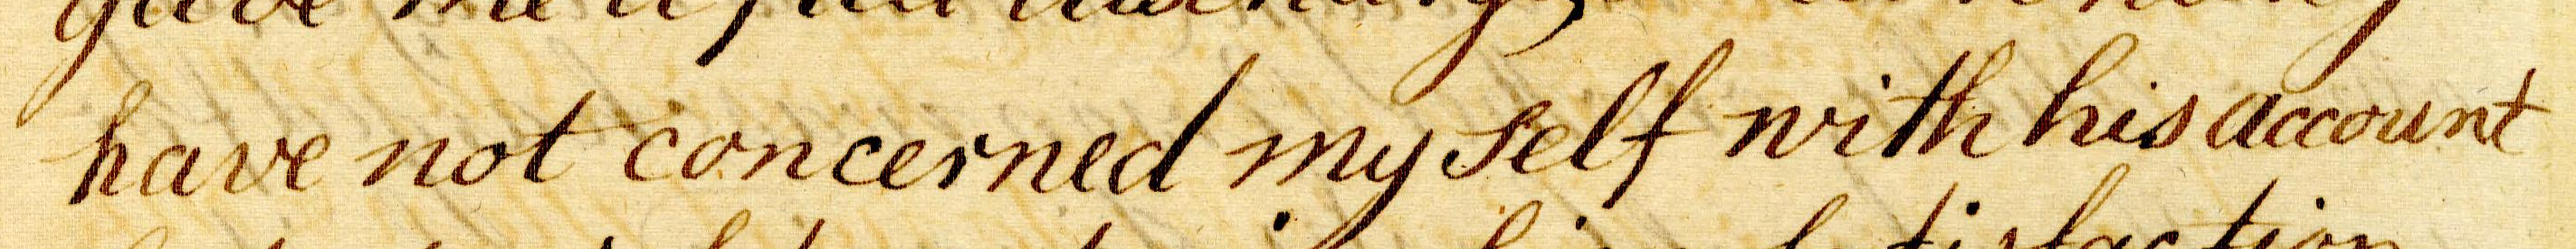have not concerned my self with his account
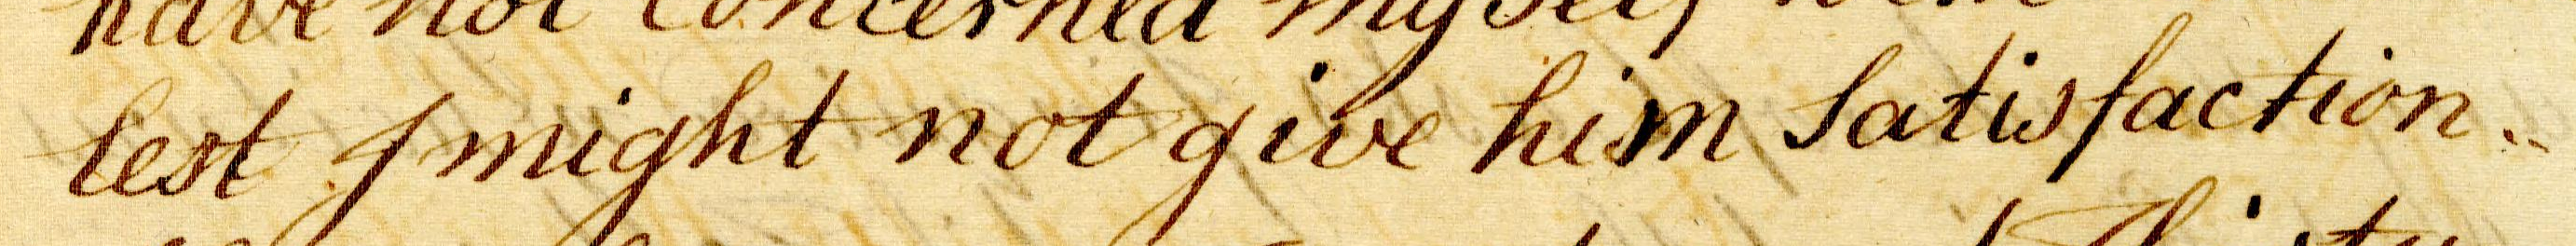lest I might not give him Satisfaction.
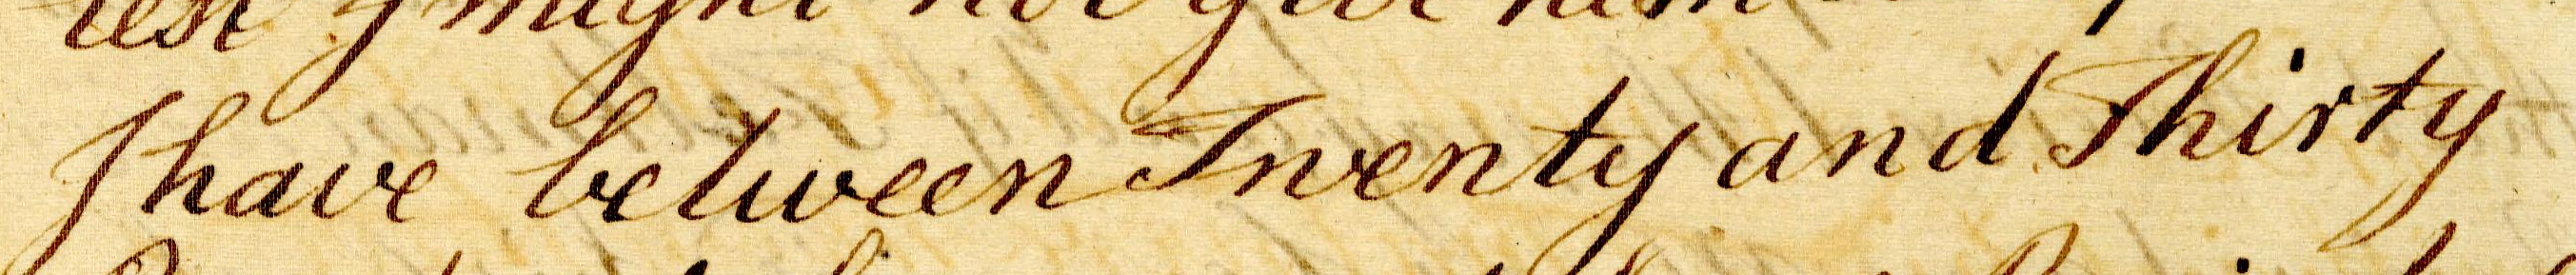I have between Twenty and Thirty
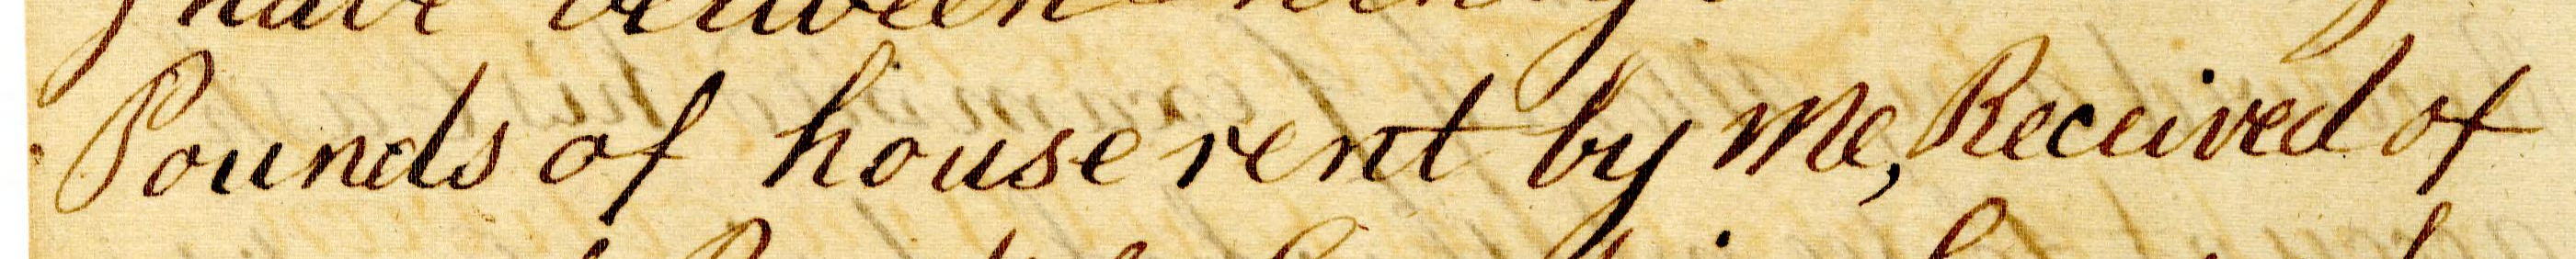Pounds of house rent by Me, Received of
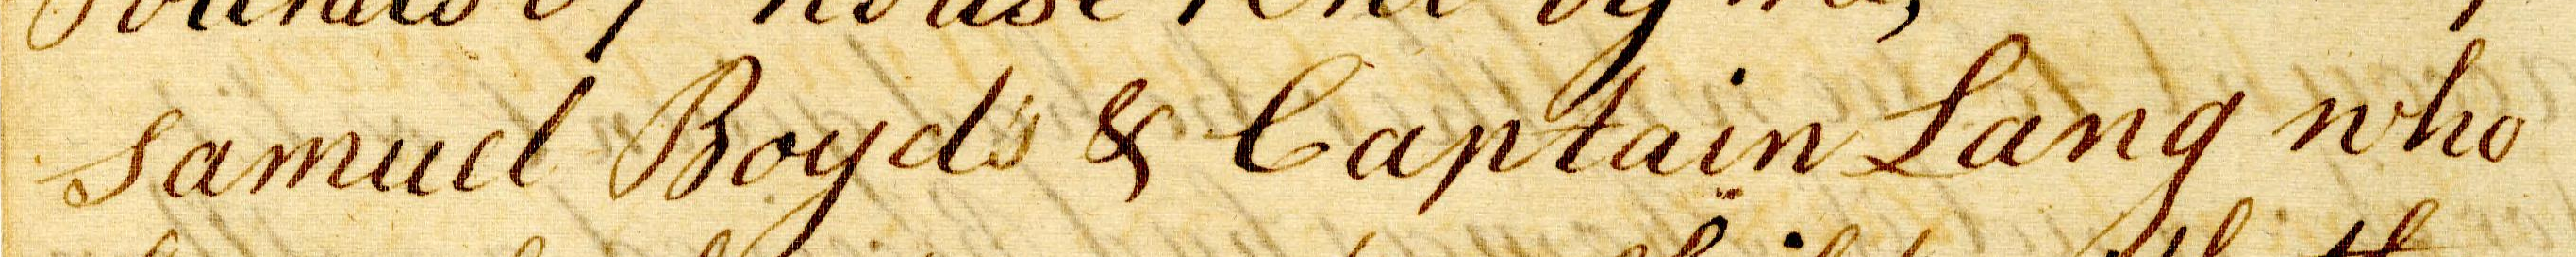Samuel Boyd's & Captain Lang who
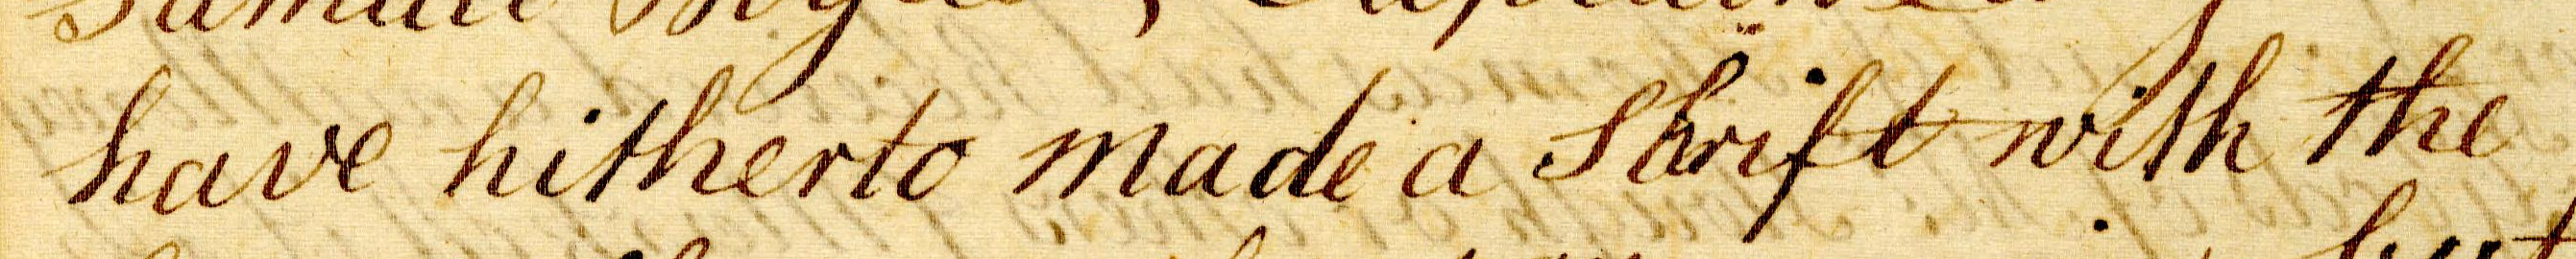have hitherto Made a Shrift with the
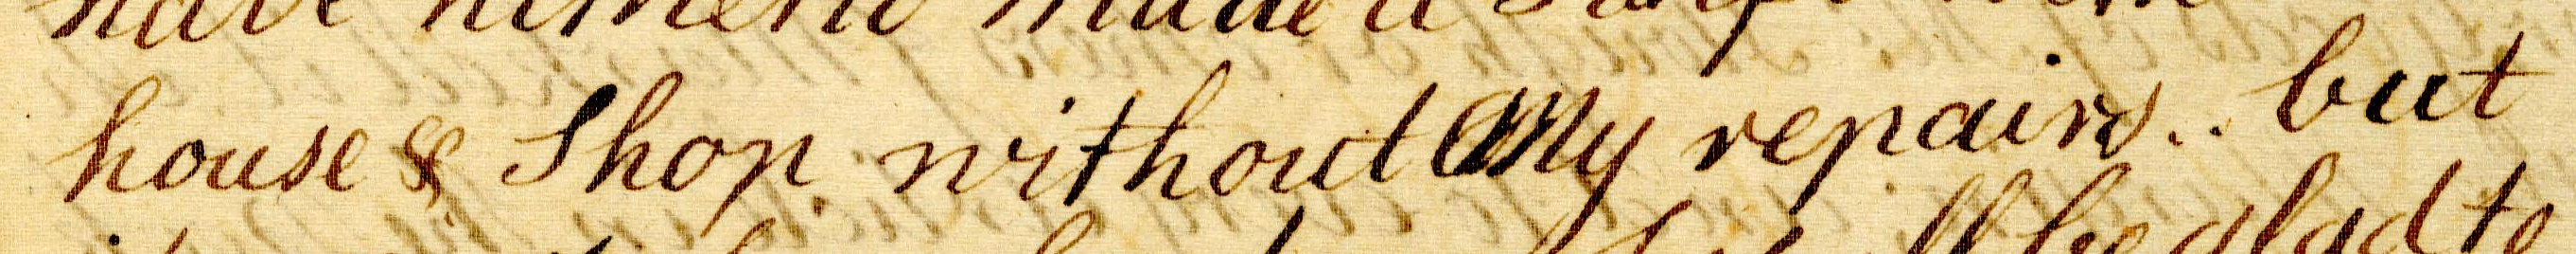house & Shop without My repairs.. but
